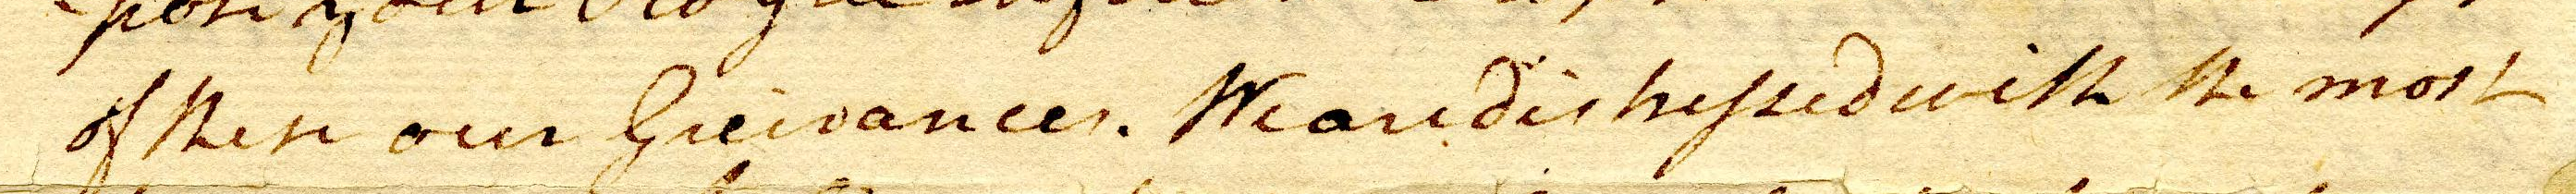of these our Greivances. We are distressed with the most
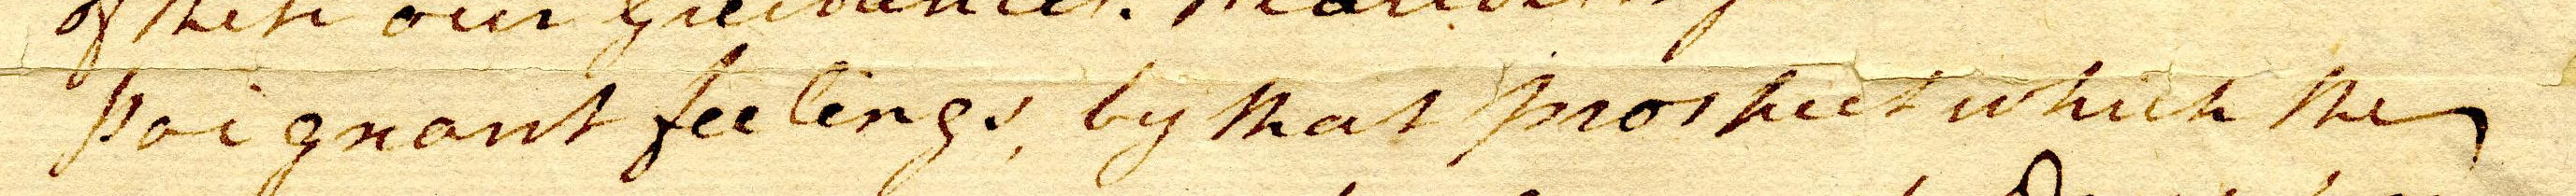poignant feelings, by that prospect which the
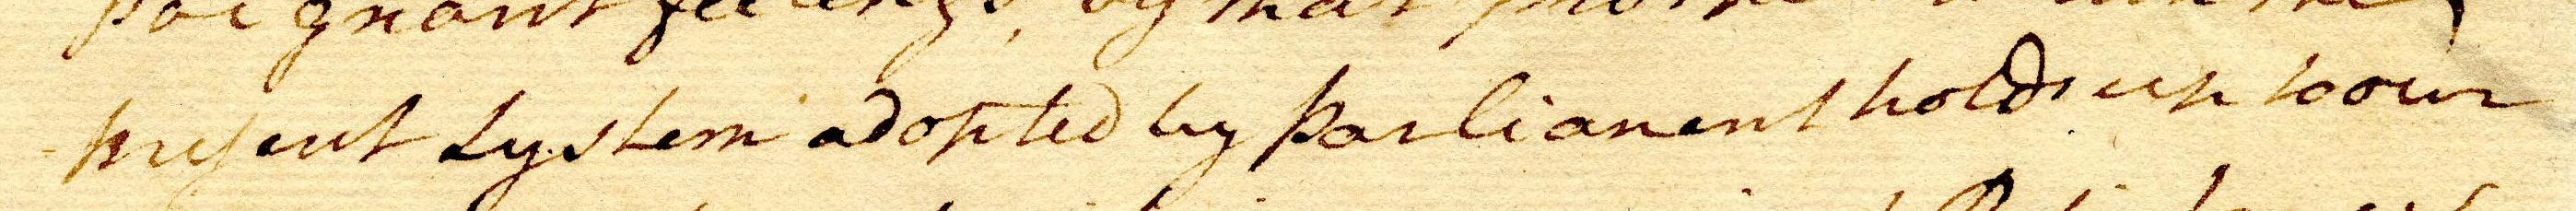present system adopted by parlianent holds up to our
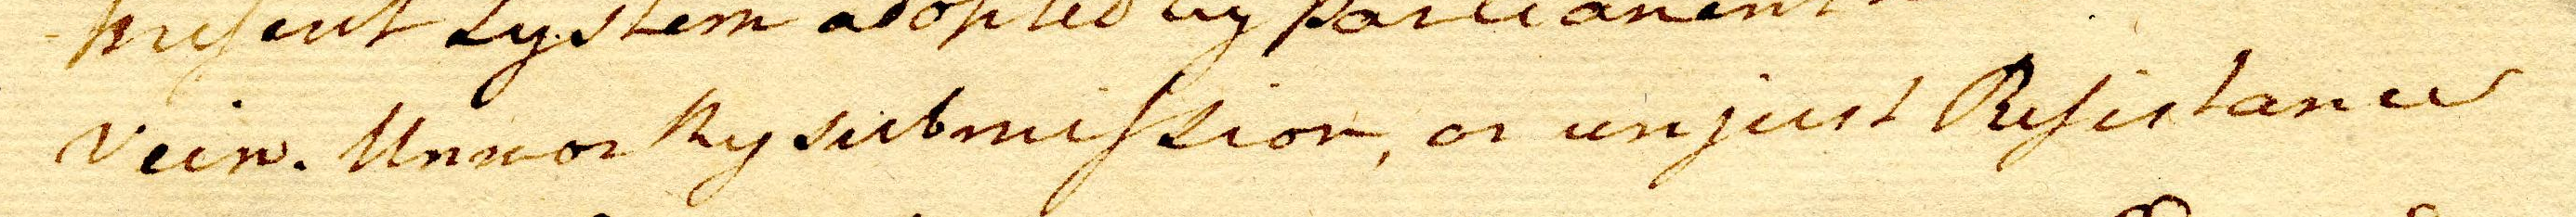vein. Unworthy submission, or unjust Resistances
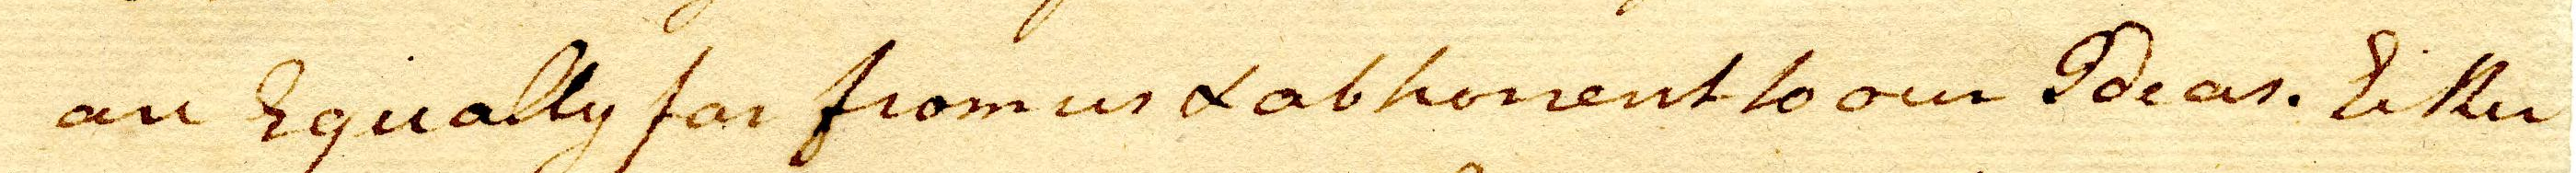are Equally far from us & abhorrent to our Ideas. Either
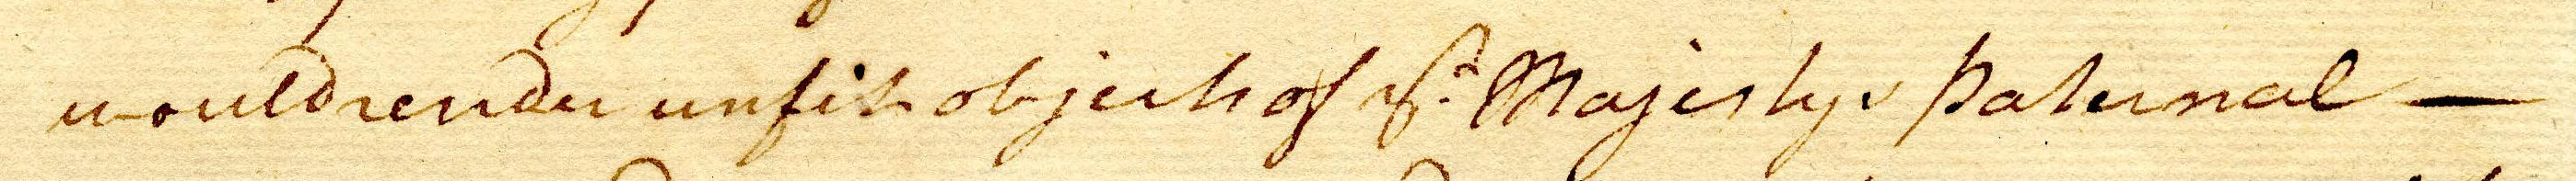wouldrender unfit objects of y^r. Majestys paternal-
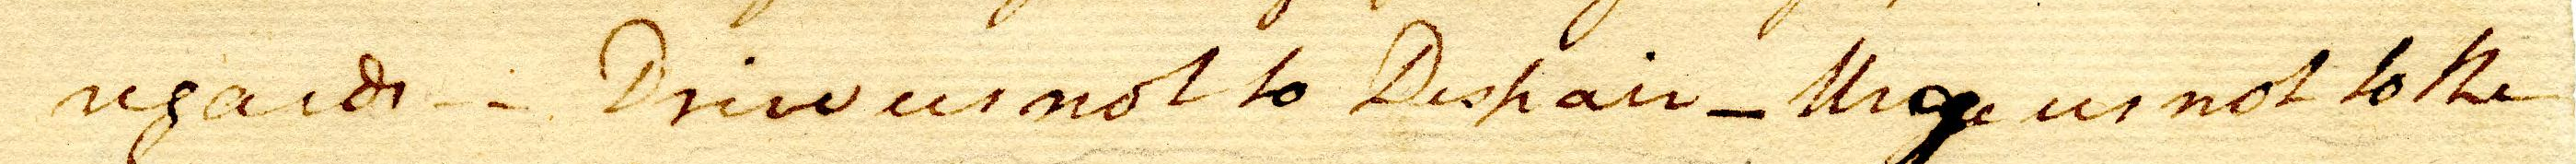regard-- Drive not to Despair- Urge us not to the
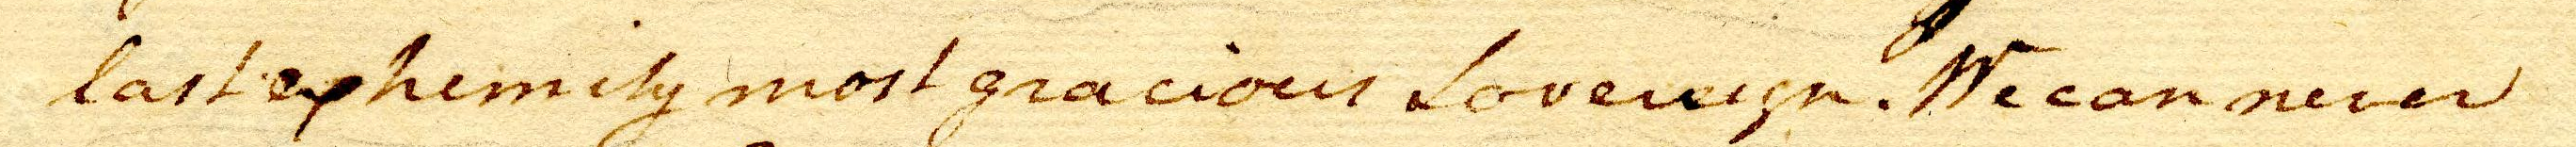last extremity most gracious Sovereign. We can never
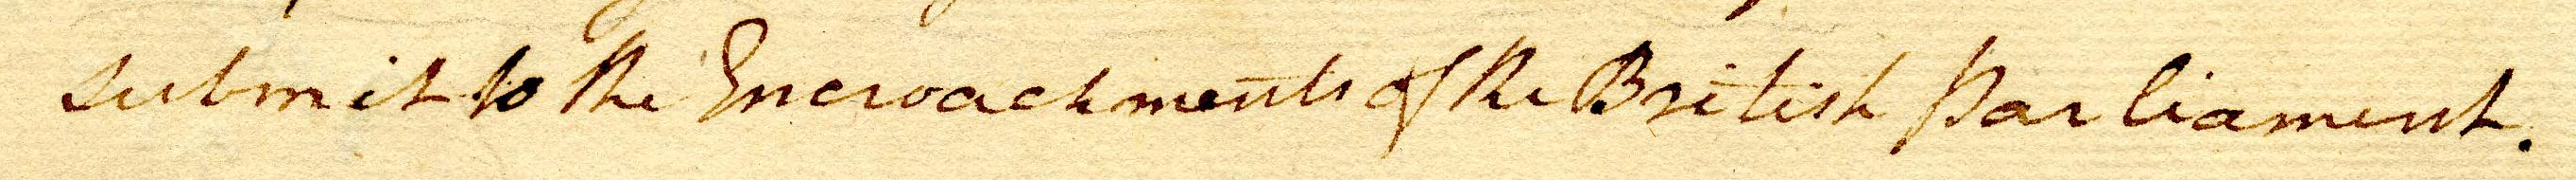submit to the Encroachments of the British Parliament.
